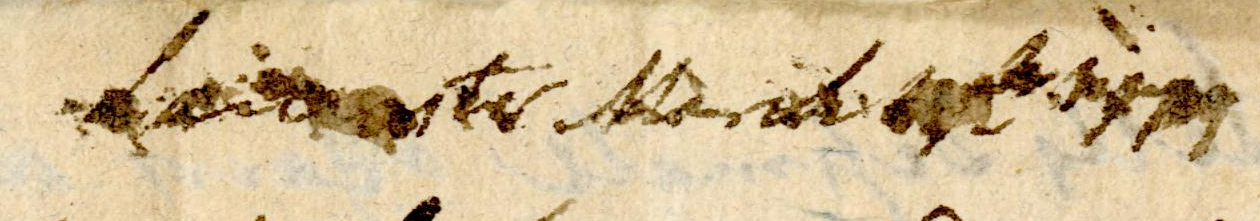Lancaster March [___]^th 1779
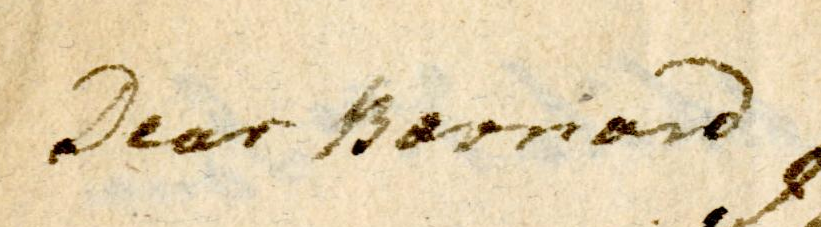Dear Barnard
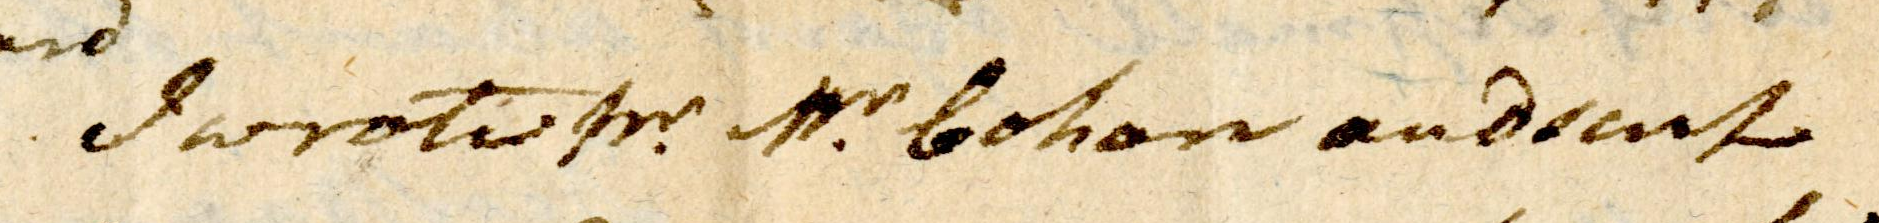I wrote p^r. M^r. Cohan and sent
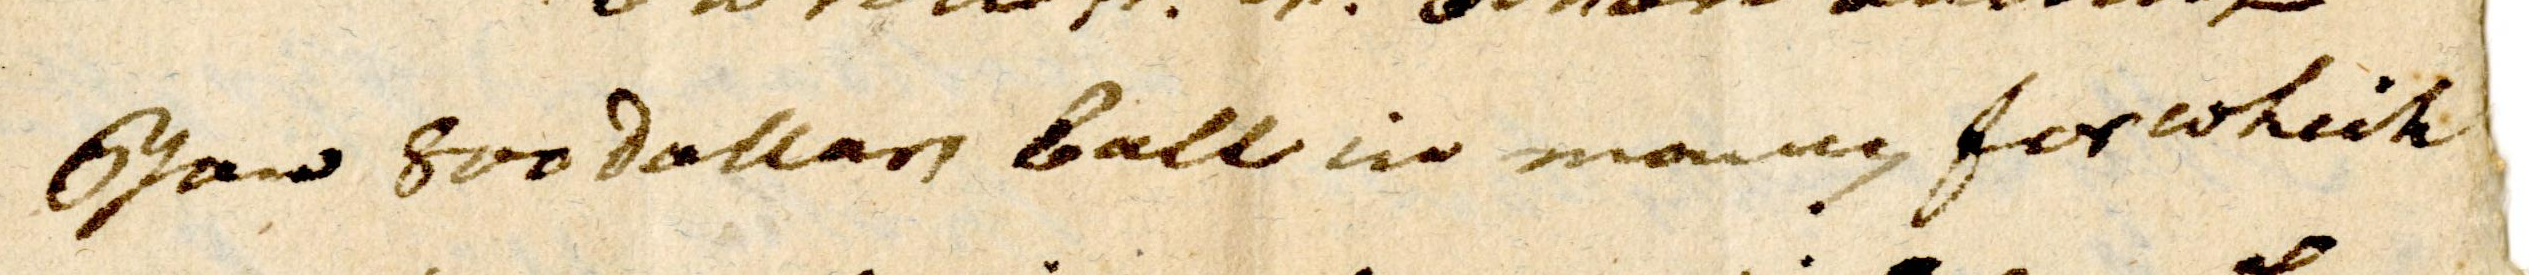you 800 dollars Call in money for which
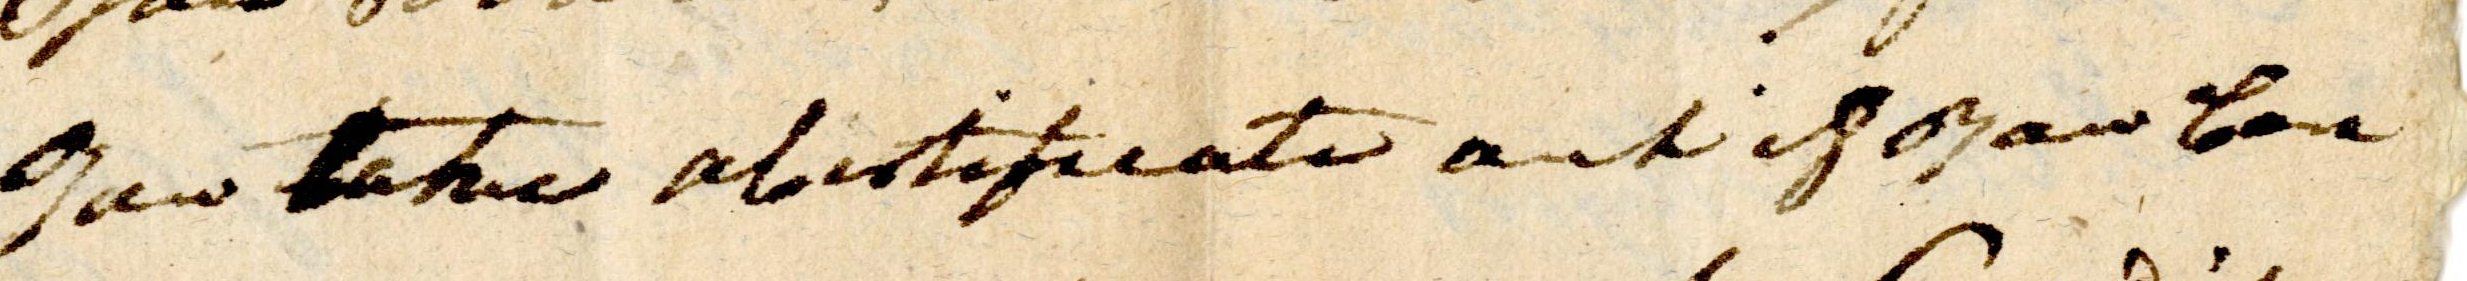You take a certificate out if you can
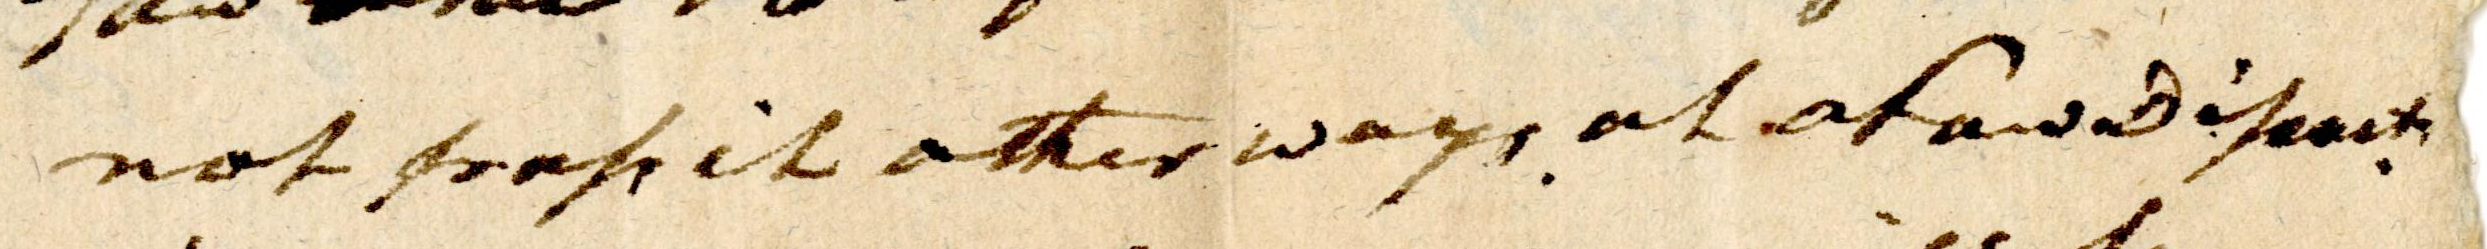not profit other ways. at of a fav^d pac^t.
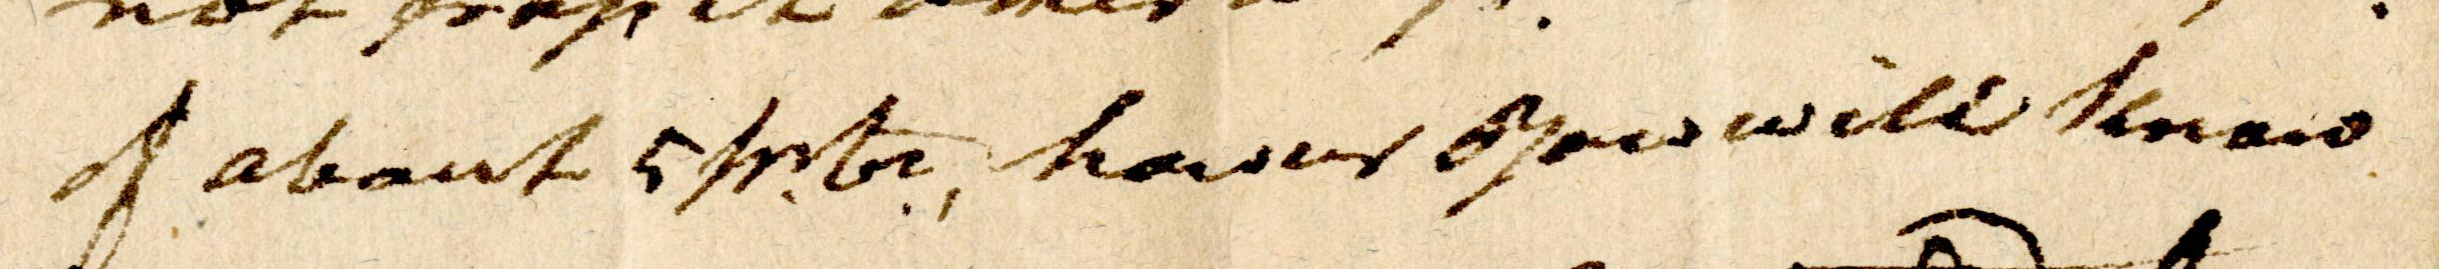of about 5 p^r. be, however you will know
